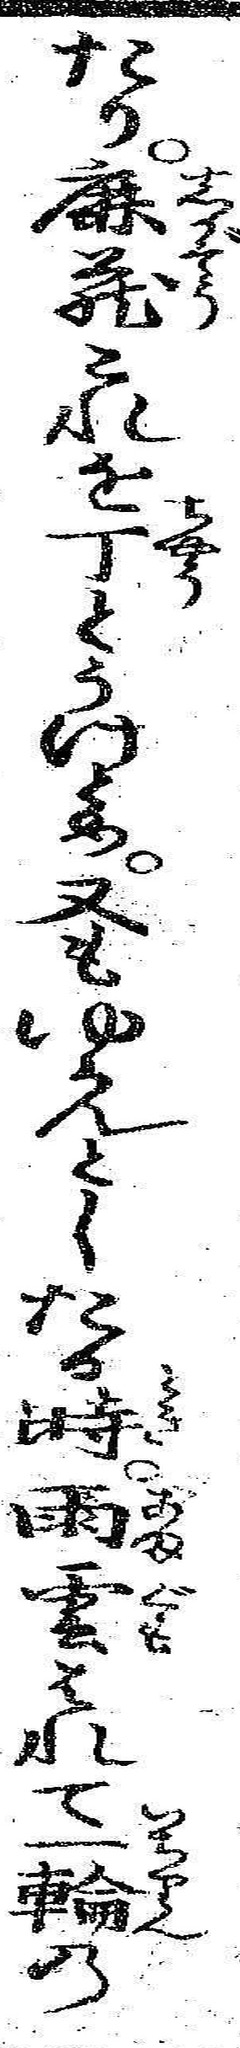たり。鹿蔵これを丁とうけとめ。又もゆかんとしたる時。雨雲はれて一輪の

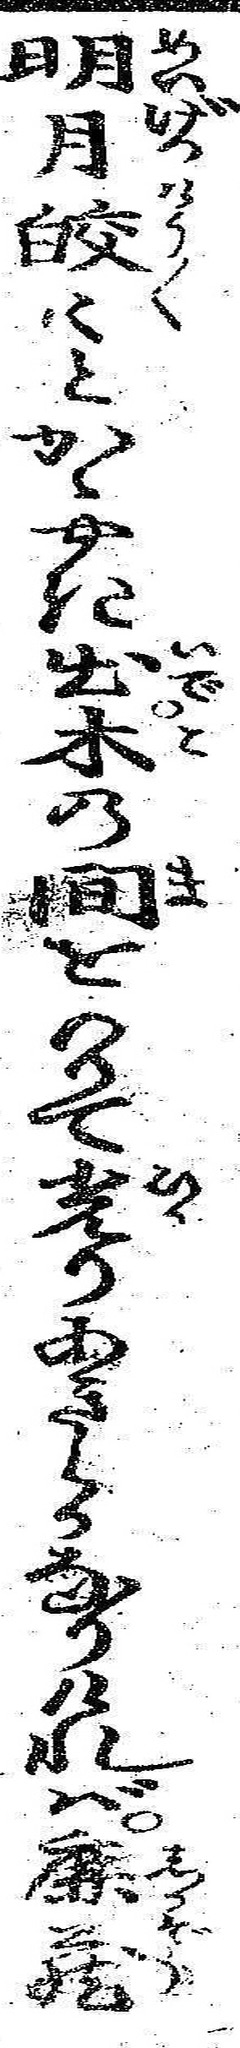明月皎々とかゝやき出。木の間をもりて光りあきらかなりければ。鹿蔵
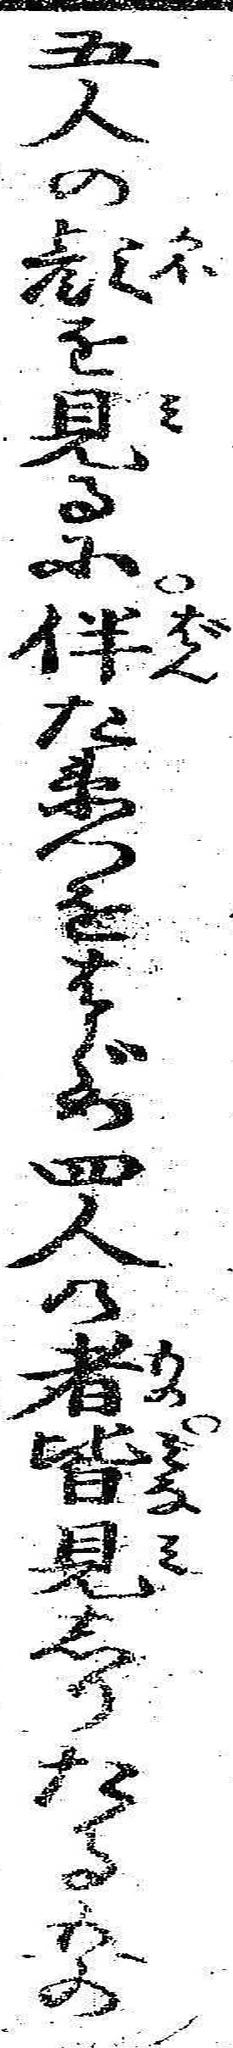五人の顔を見るに。伴左衛門をはじめ四人の者。皆見しりたるもの
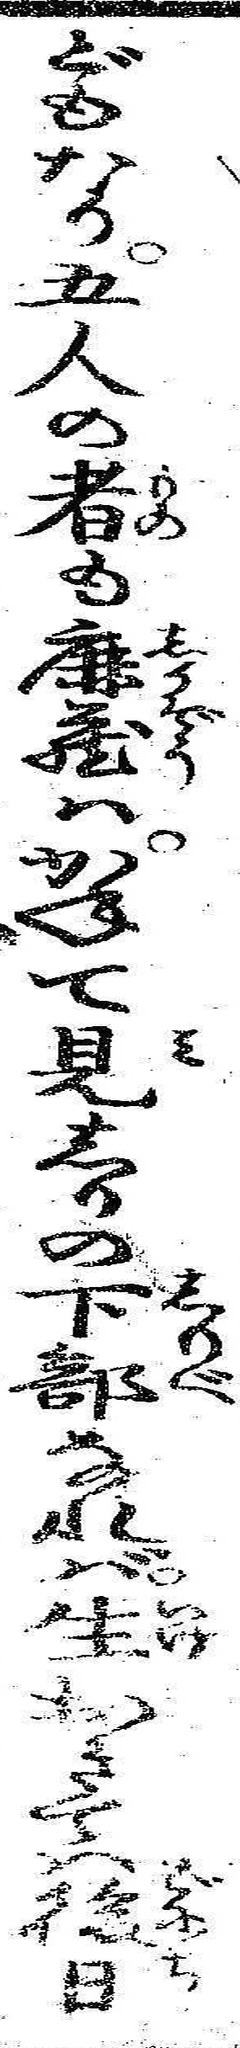どもなり。五人の者も鹿蔵は。かねて見しりの下部なれば。生おきては後日
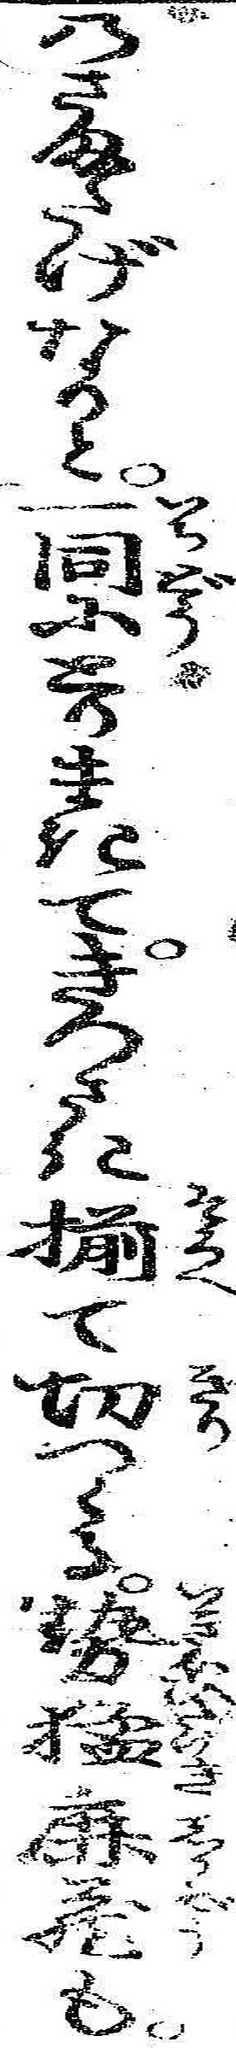のさまたげなりと。一同にとりまきて。きつさき揃て切つくる。勢猛鹿蔵も。
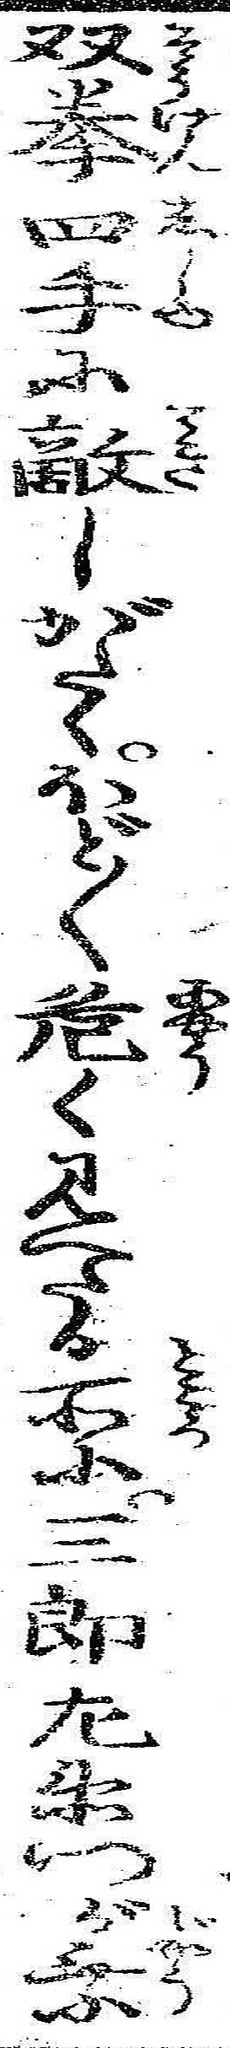双拳四手に敵しがたく。ほど〳〵危く見へたる所に。三郎左衛門が乗
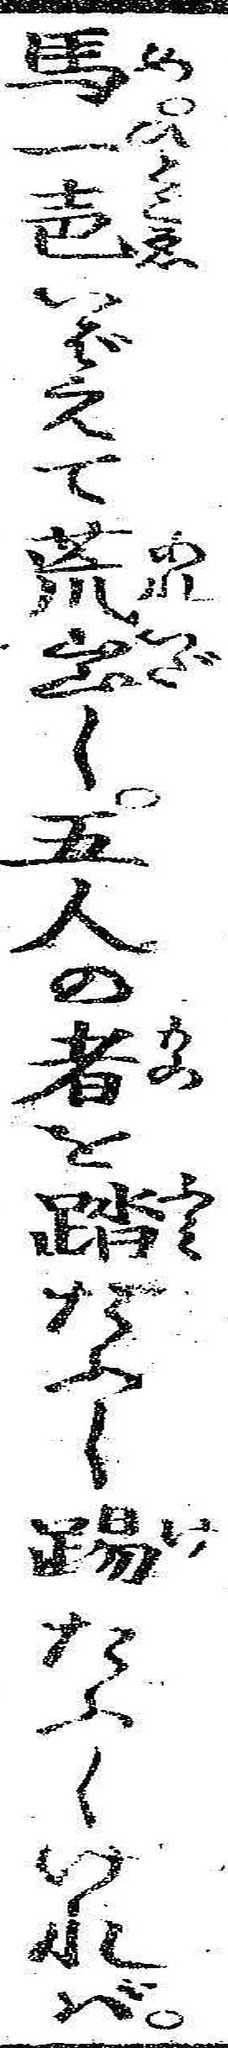馬。一声いばえて荒出し。五人の者を踏たふし踢たふしければ。
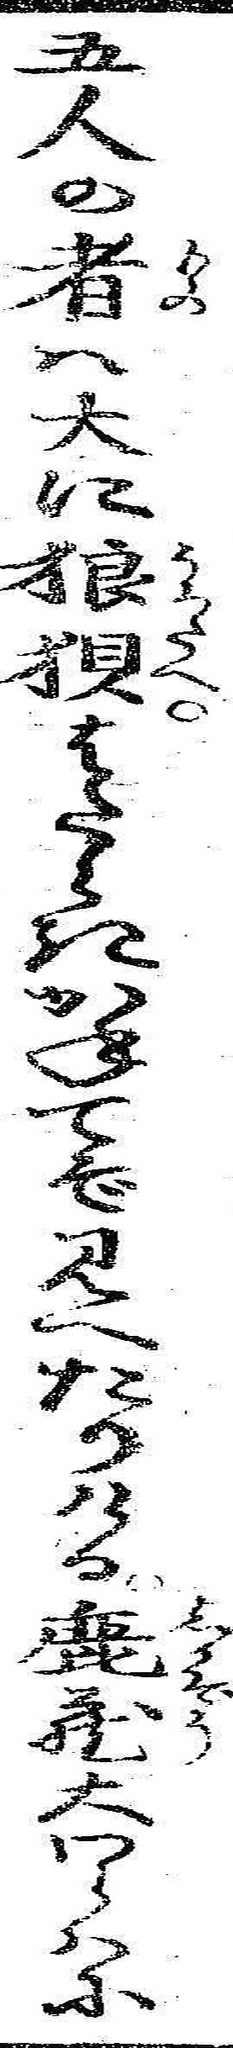五人の者は大に狼狽。はたらきかねてぞ見へたりける。鹿蔵大わらはに
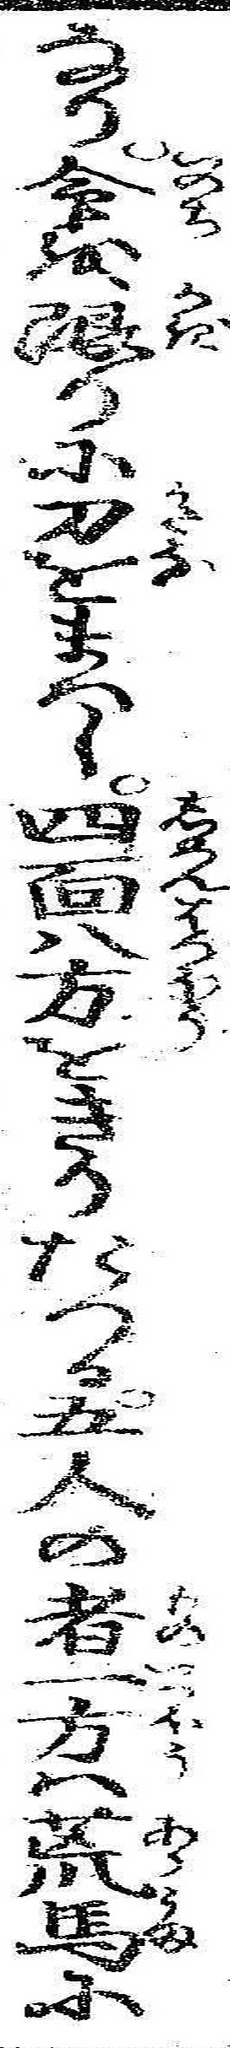なり。命を限りに刀をまはし。四面八方をきりたつる。五人の者一方は荒馬に
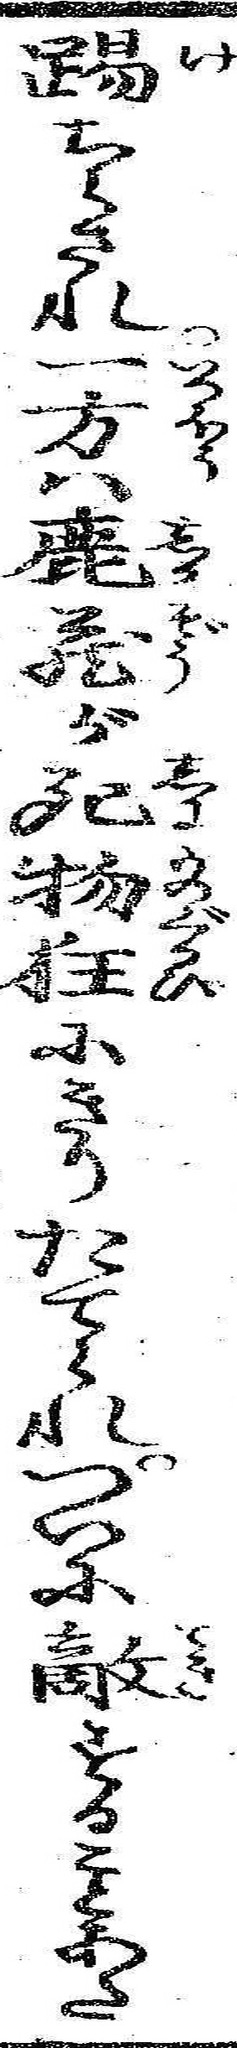踢ちらされ。一方は鹿蔵が死物狂にきりたてられ。ついに敵することあた
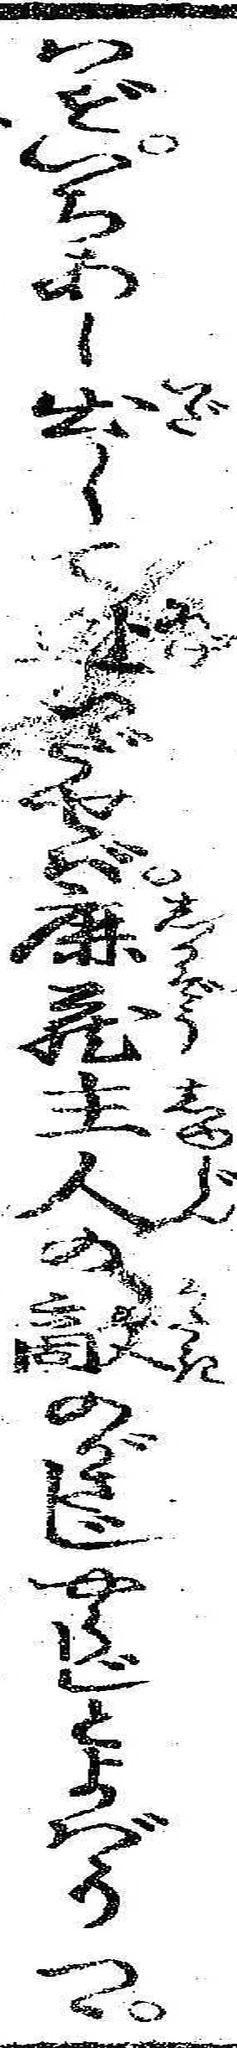はず。いちあし出して逃いだせば。鹿蔵主人の敵のがさじやらじとよばゝりつゝ。
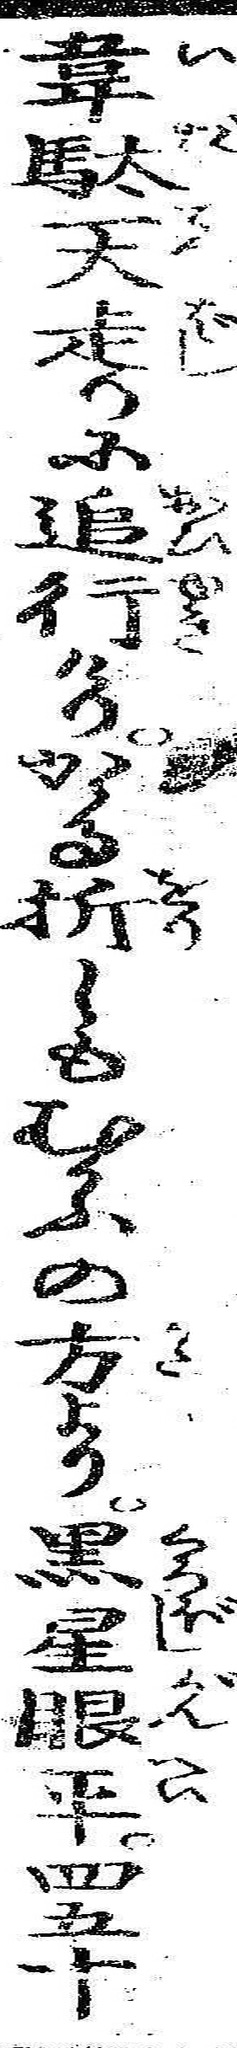葦駄天走りに追行けり。かゝる折しもむかふの方より。黒星眼平。四五十
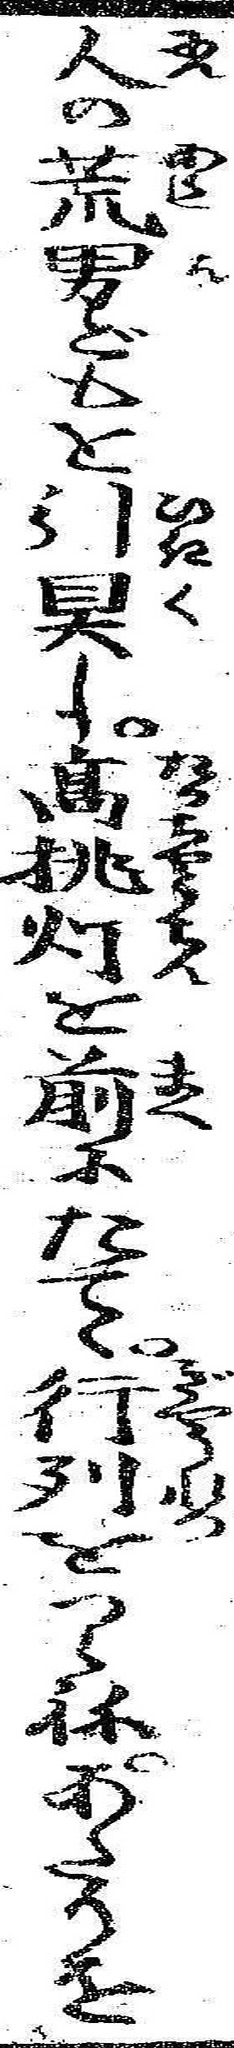人の荒男どもを引具し。高挑灯を前にたてゝ。行列をつらね。あたりを
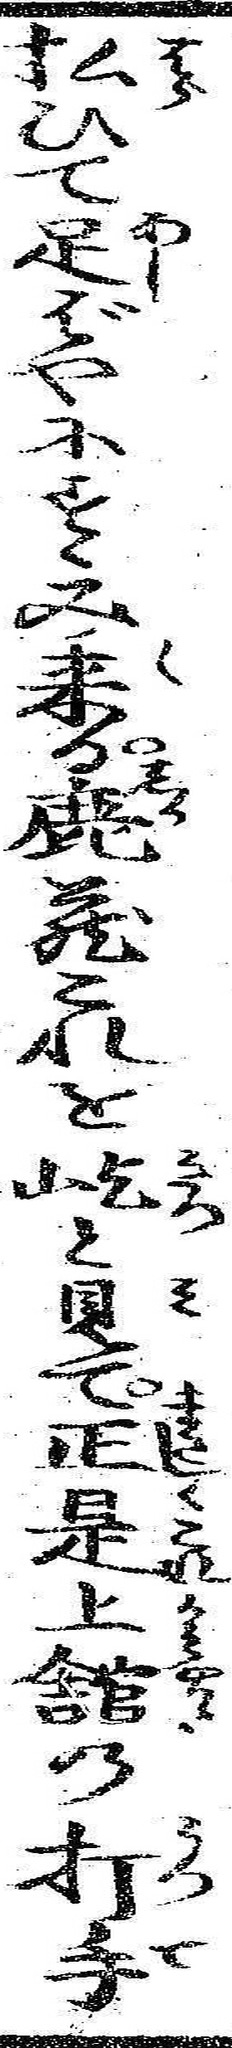払ひて足ばやにすゝみ来る。鹿蔵これを屹と見て。正是上館の打手
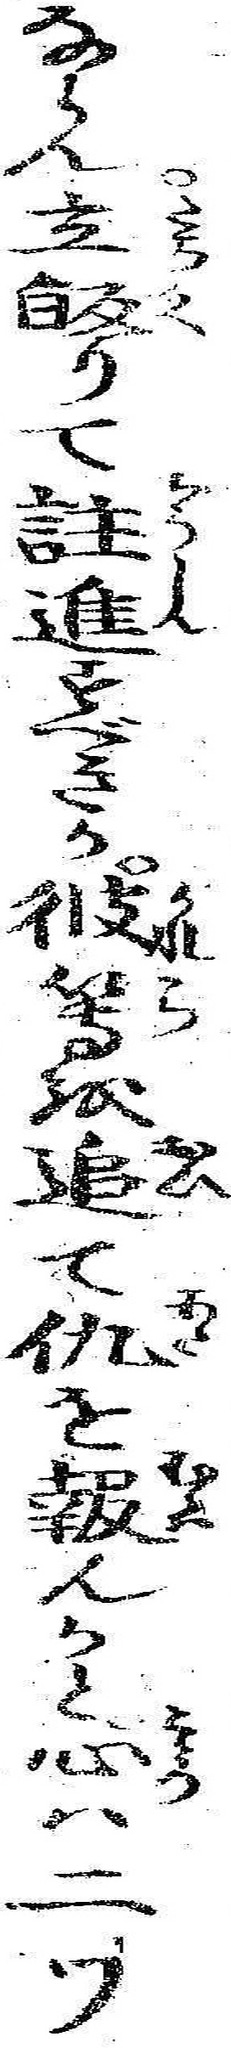ならん。立帰りて註進すべきか。彼等を追て仇を報んかと。心は二ツ
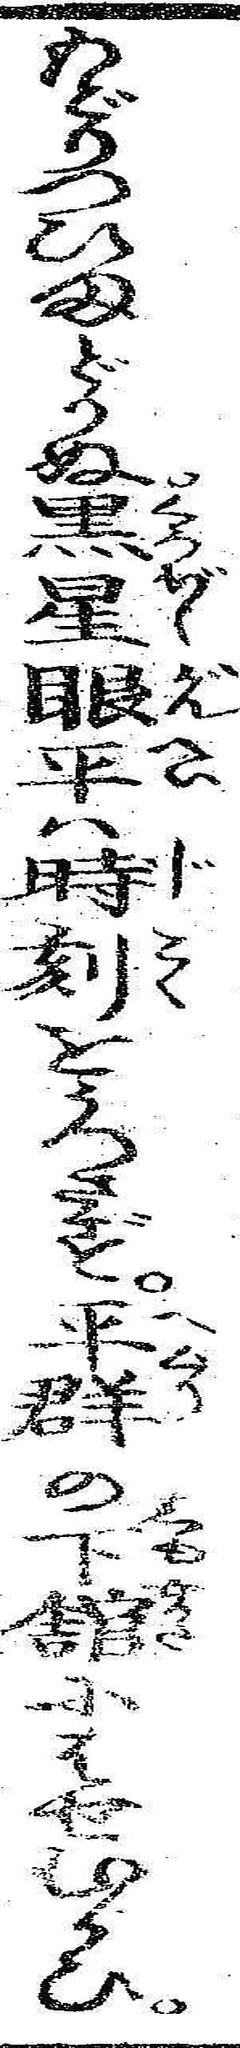もどりつひまどりぬ。黒星眼平は時刻をうつさず。平群の下館にはせむかひ。
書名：昔話稲妻表紙
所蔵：国文学研究資料館
